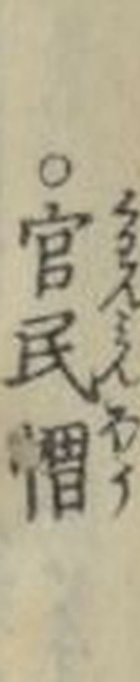○官民帽
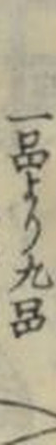一品より九品
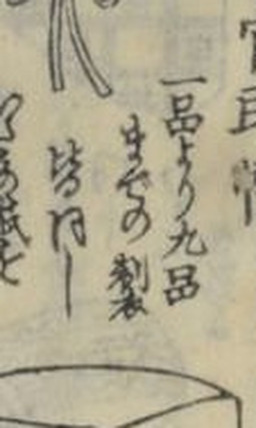までの製
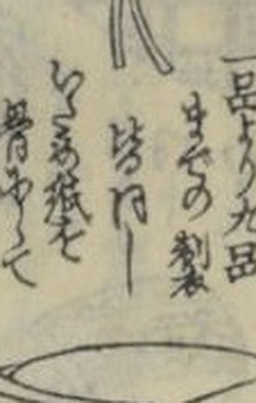皆同し
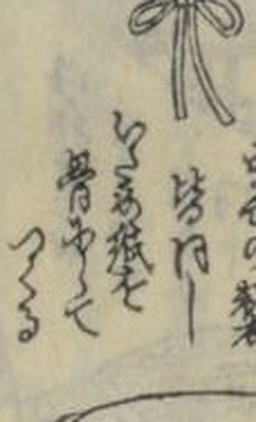いたに紙を
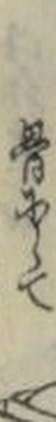骨にして
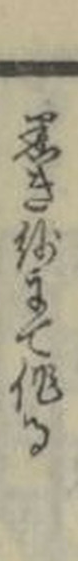黒き紗にて作る
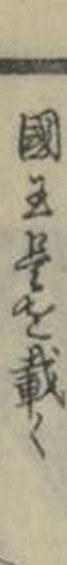国王是を載く
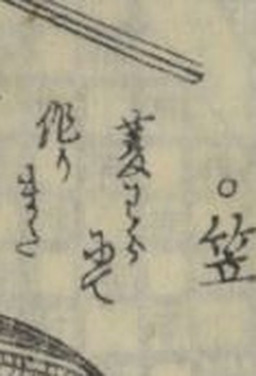菱わらにて
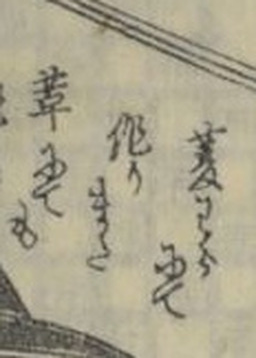作りまた
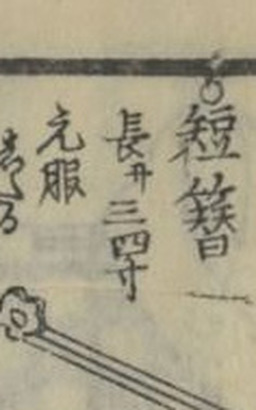長サ三四寸
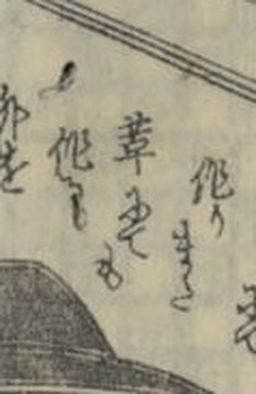葦にても
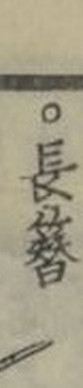○長簪
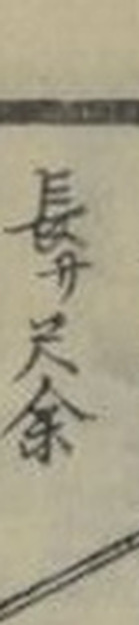長サ尺余
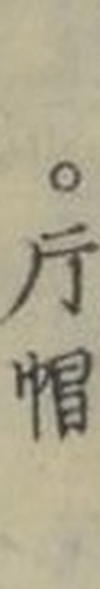○片帽
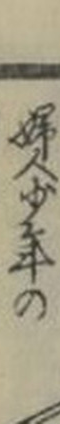婦人少年の
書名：琉球解語
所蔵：University of the Ryukyus Library
